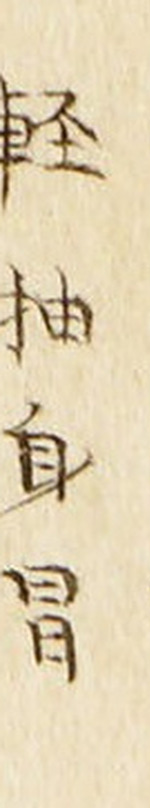軽抽身冒
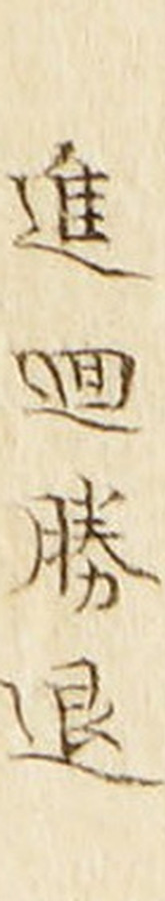進廻勝退
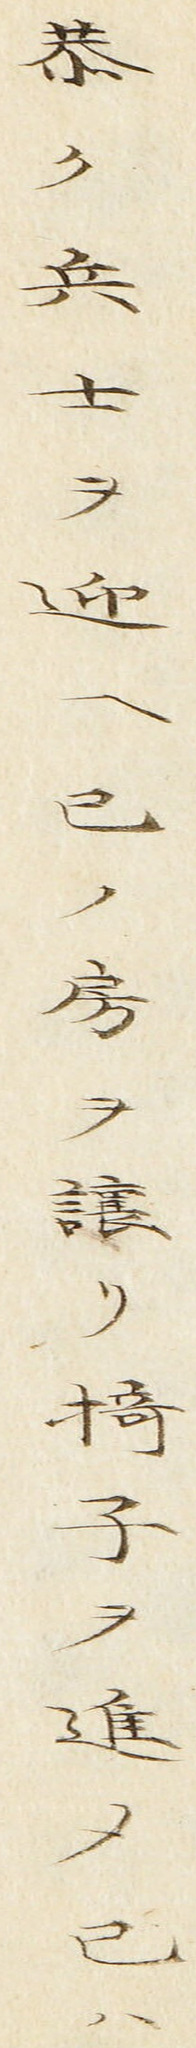恭ク兵士ヲ迎ヘ己ノ房ヲ譲リ椅子ヲ進メ己ハ
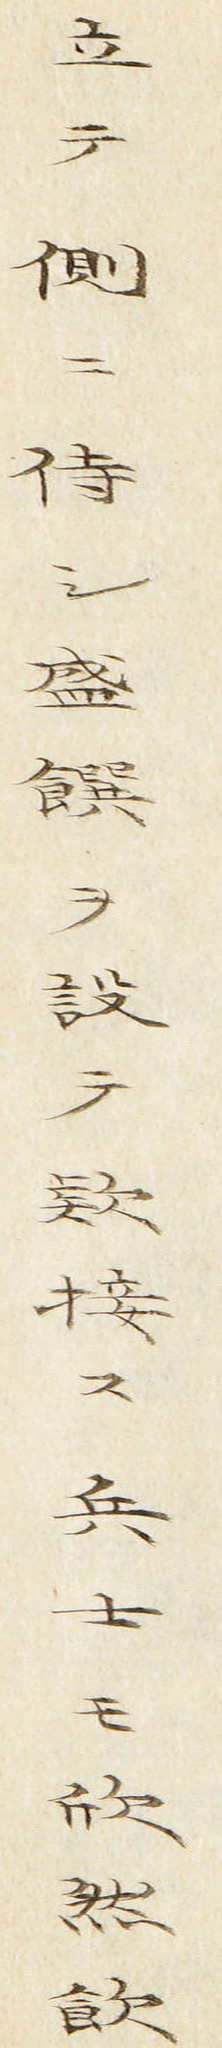立テ側ニ侍シ盛饌ヲ設テ歓接ス兵士モ欣然飲
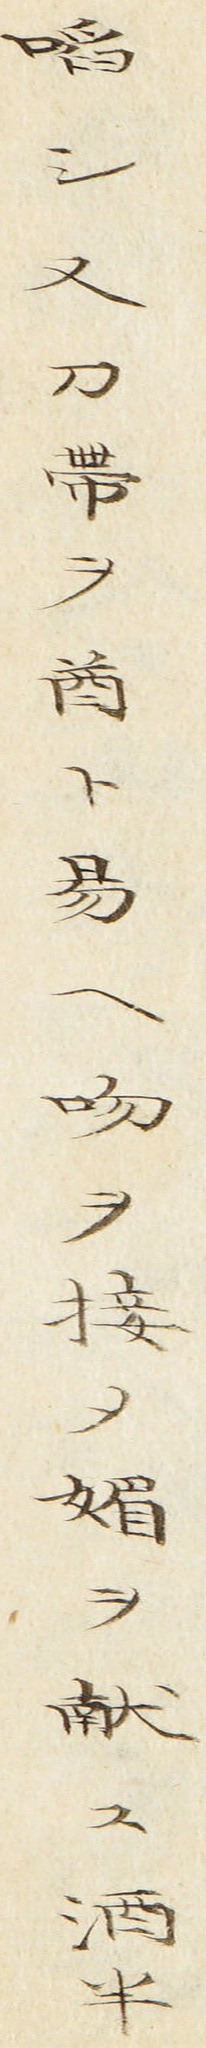㗖シ又刀帯ヲ酋ト易ヘ吻ヲ接シテ媚ヲ献ス酒半
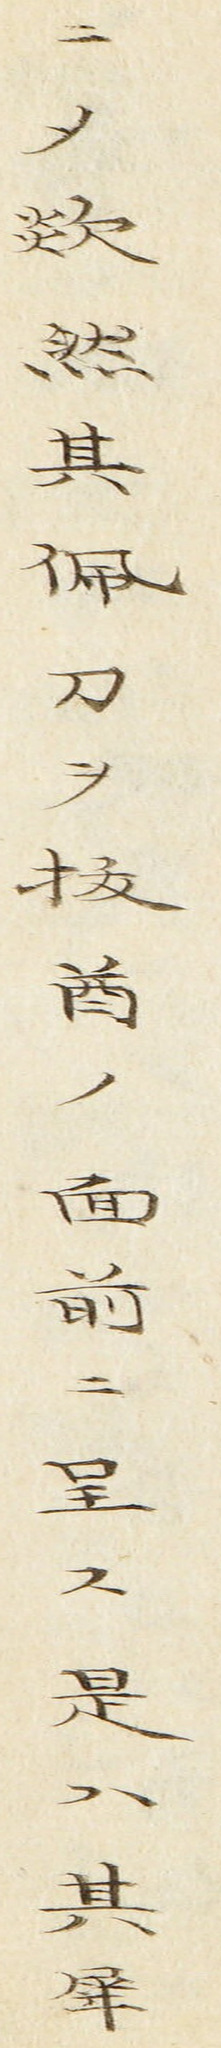ニシテ欻然其佩刀ヲ抜酋ノ面前ニ呈ス是ハ其犀
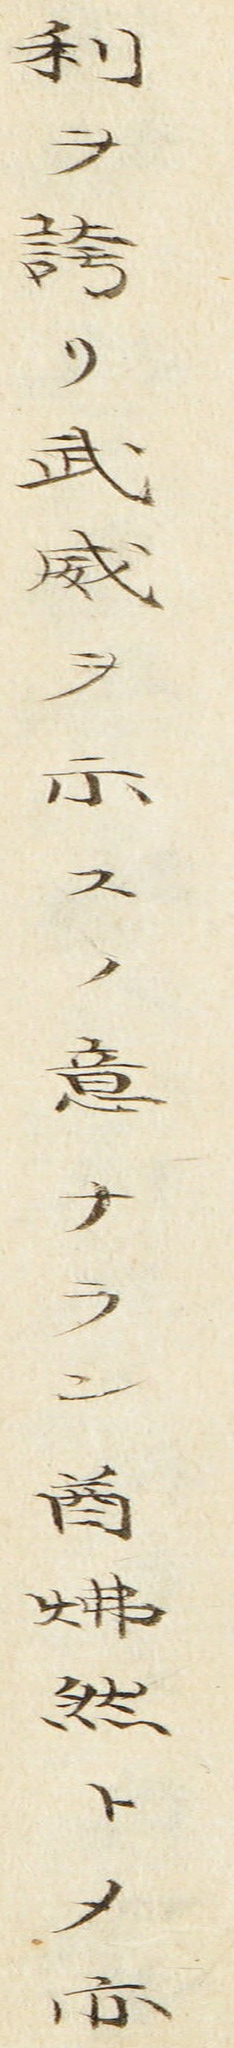利ヲ誇リ武威ヲ示スノ意ナラン酋然トシテ亦

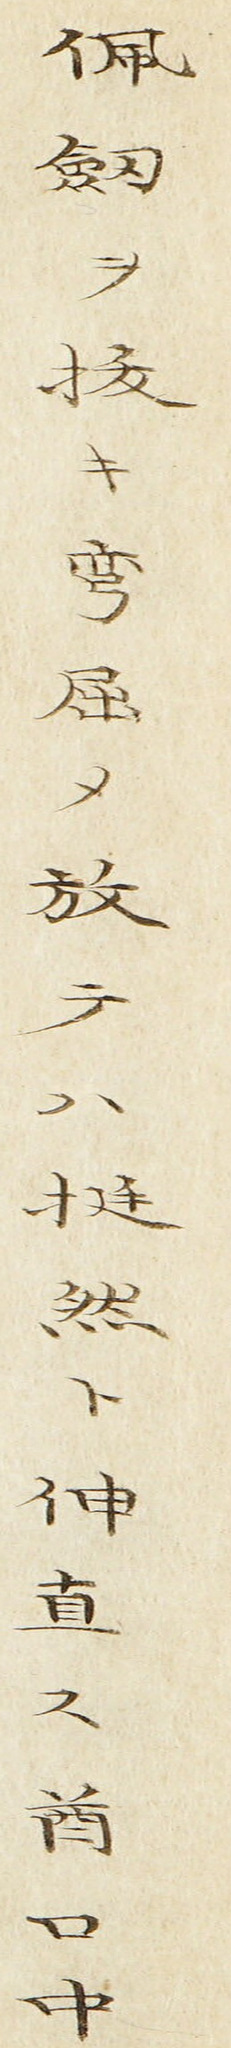佩劒ヲ抜キ弯屈シテ放テハ挺然ト伸直ス酋口中
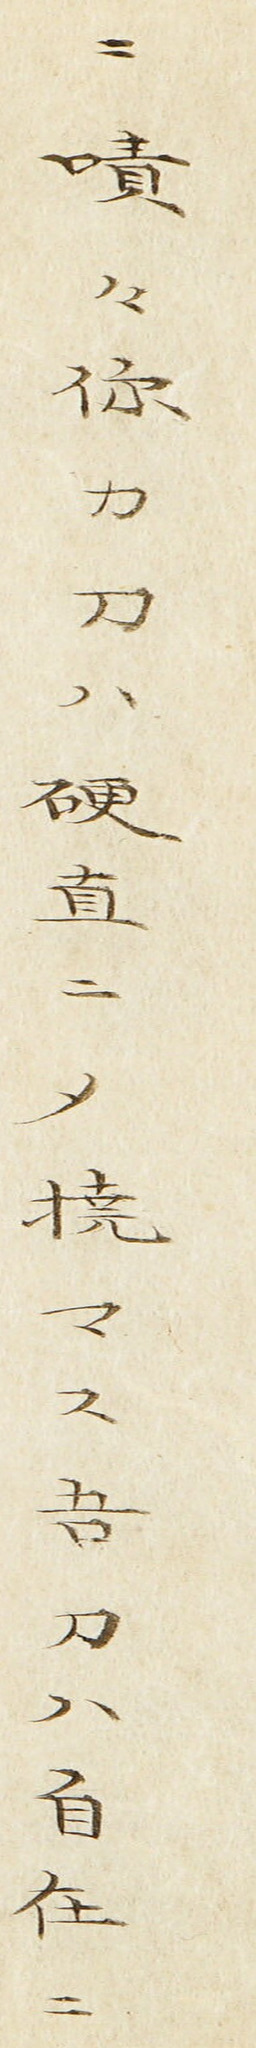ニ嘖々你カ刀ハ硬直ニシテ撓マス吾刀ハ自在ニ
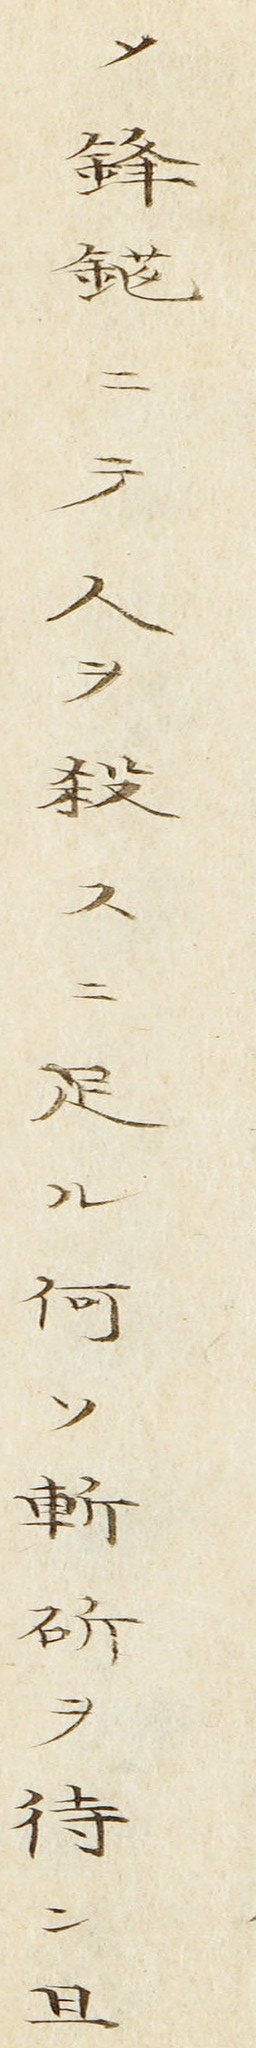シテ鋒ニテ人ヲ殺スニ足ル何ソ斬斫ヲ待ン且
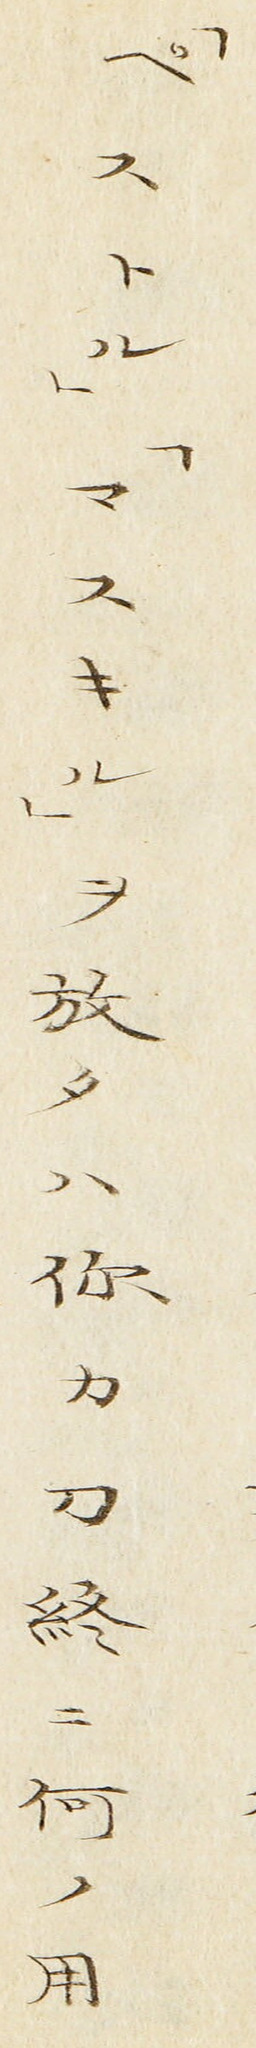「ペストル」「マスキル」ヲ放タハ你カ終ニ何ノ用
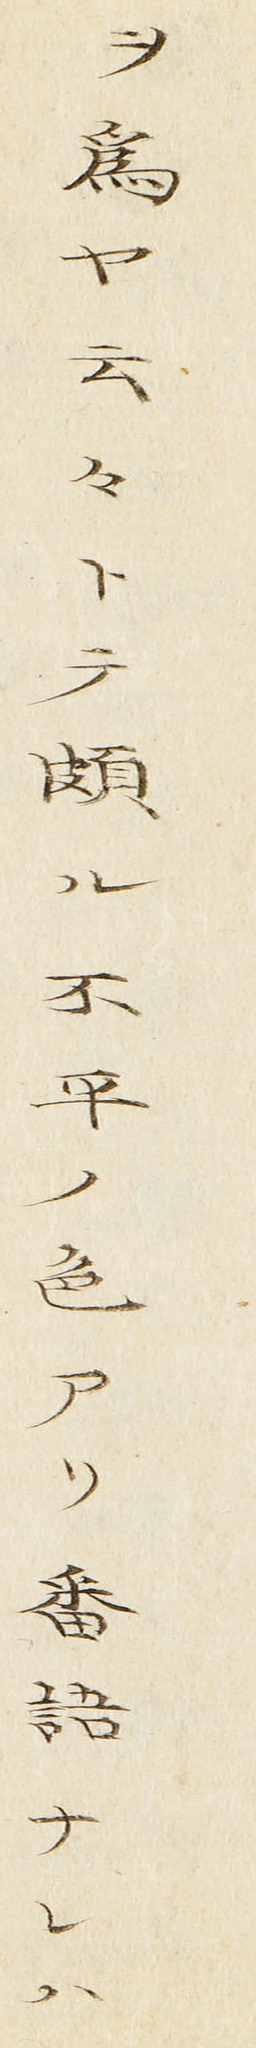ヲ為ヤ云々トテ頗ル不平ノ色アリ番語ナレハ
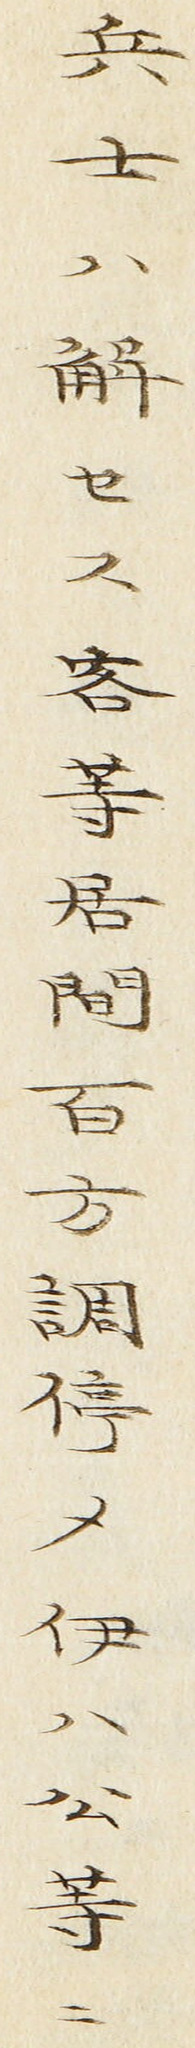兵士ハ解セス客等居間百方調停シテ伊ハ公等ニ
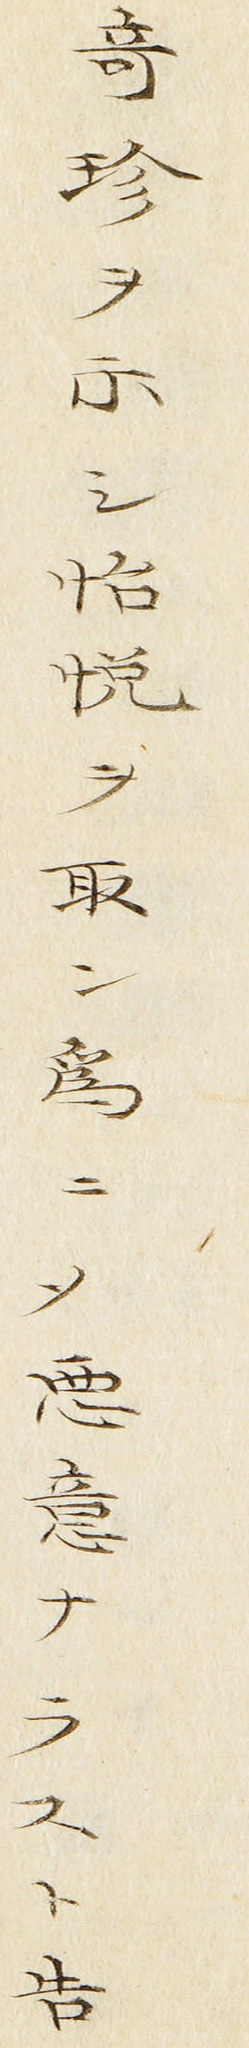奇珍ヲ示シ怡悦ヲ取ン為ニシテ悪意ナラスト告
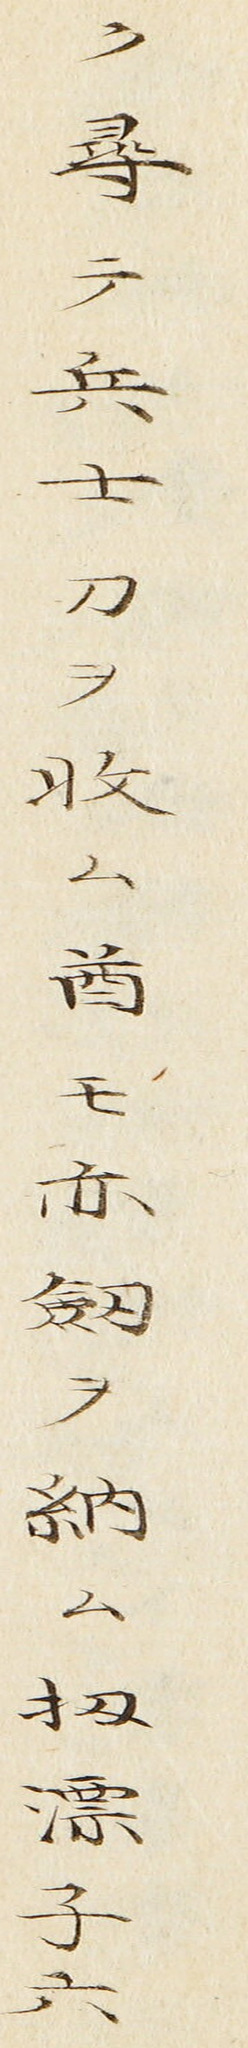ク尋テ兵士刀ヲ収ム酋モ亦劒ヲ納ム扨漂子六
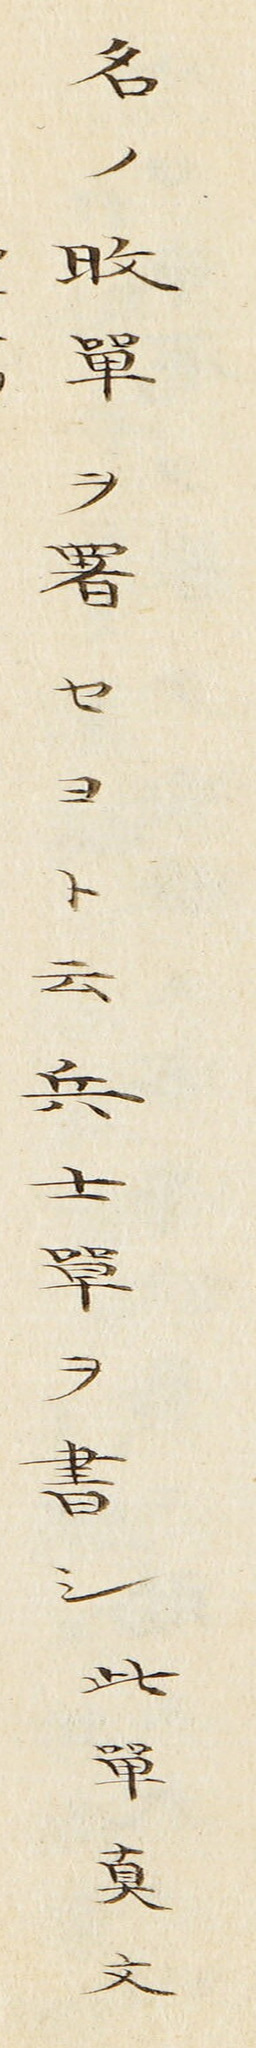名ノ單ヲ署セヨト云兵士單ヲ書シ此單真文
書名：蕃談
